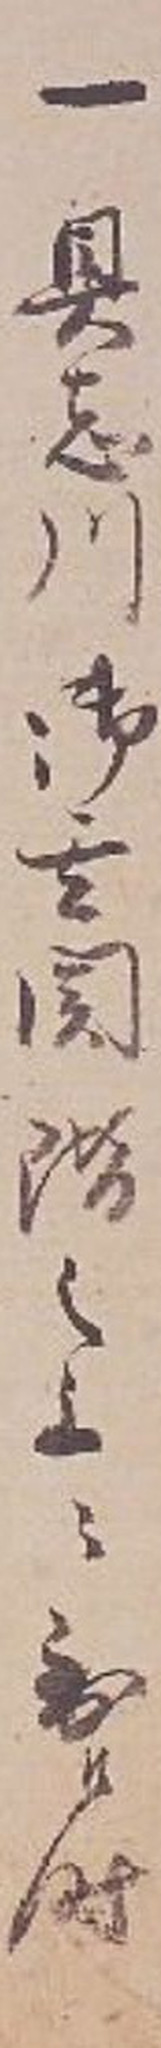一具志川御玄関階之上に到候時
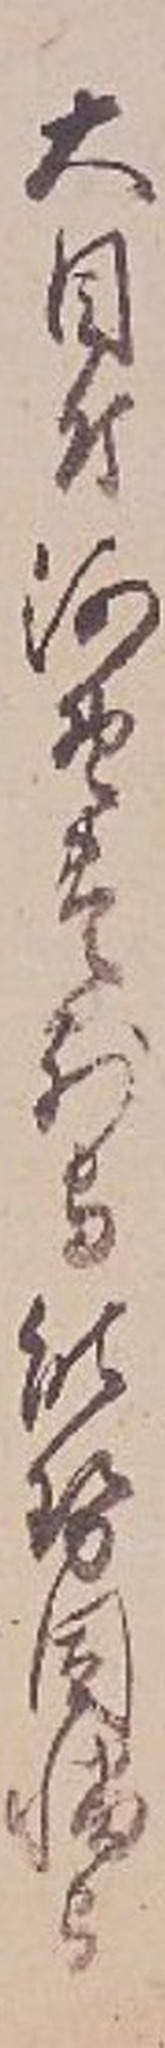大目付河野豊前守能勢因幡守
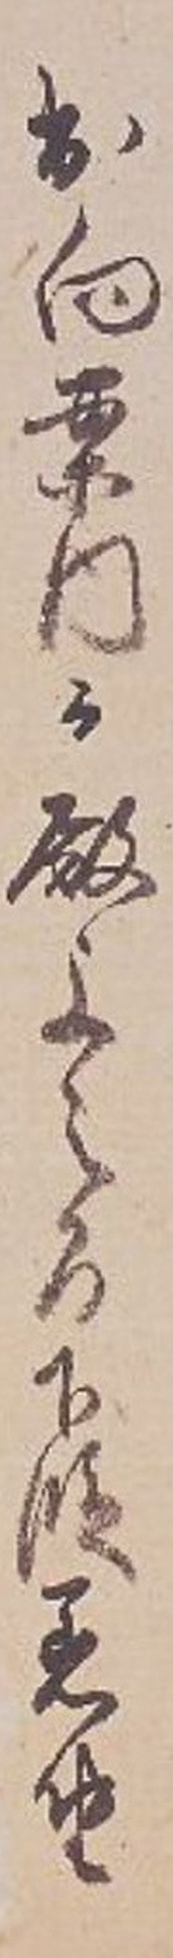出向裏門候殿上之間下段着座
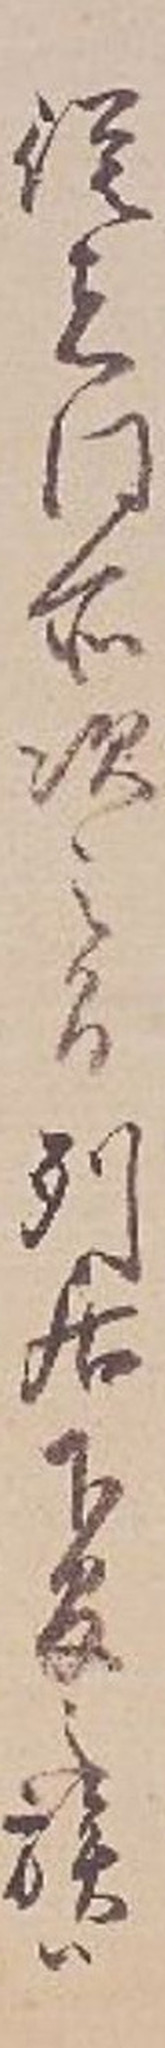従者同所次之間列居下之族は
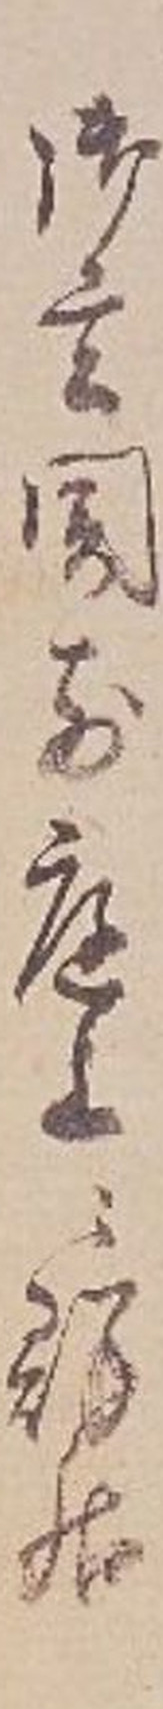御玄関前庭上に群居
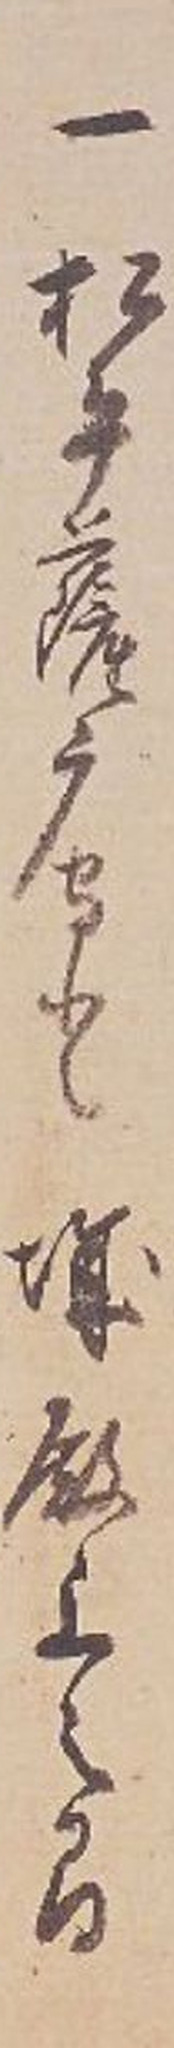一松平薩摩守登城殿上之間
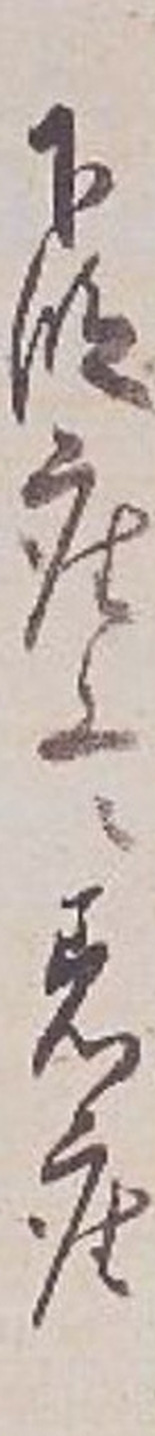下段座上に着座
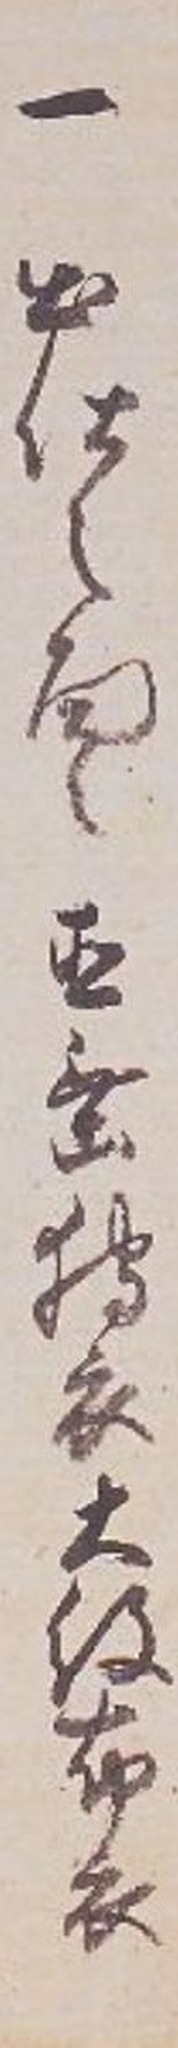一出仕之面々直垂狩衣大紋布衣
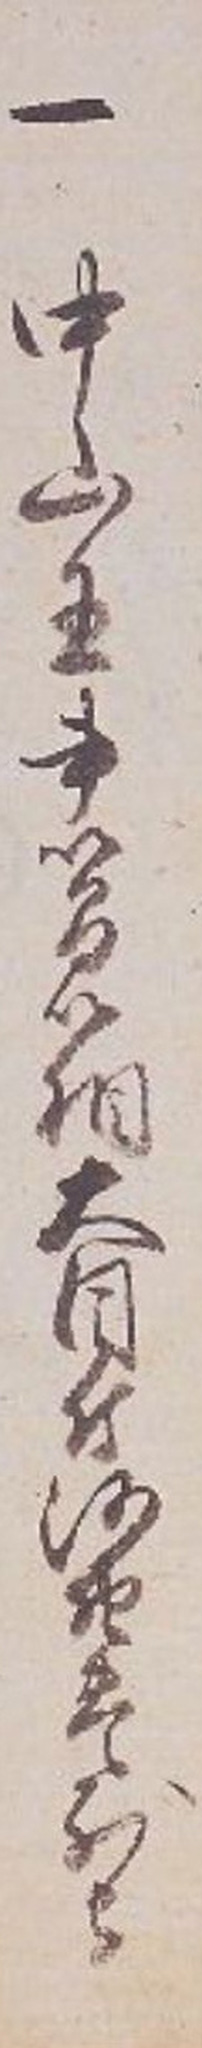一中山王書簡箱大目付河野豊前守
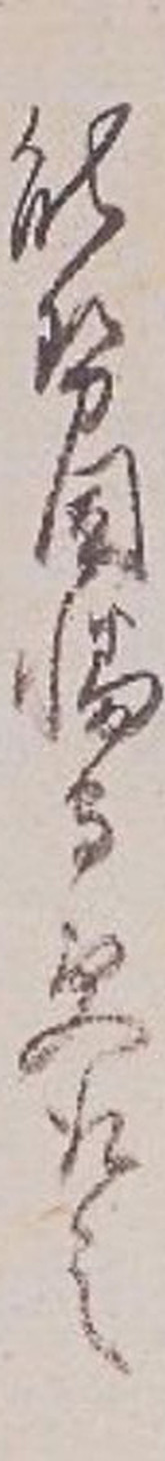能勢因幡守受取候
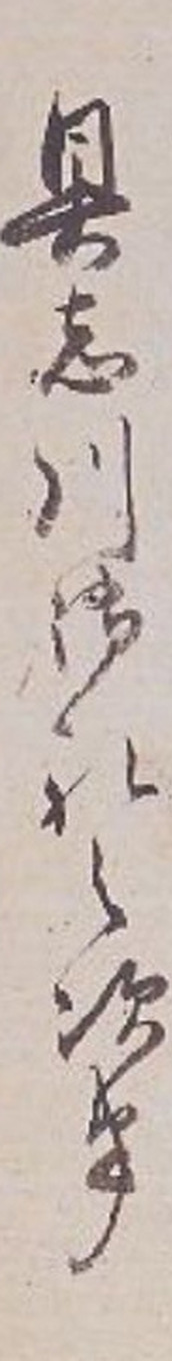具志川御礼之次第

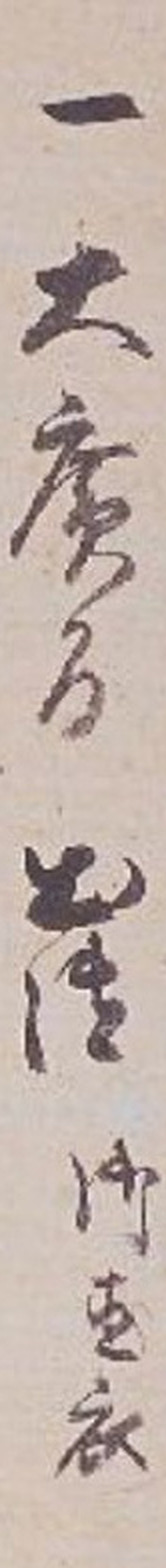一大広間出張御直衣
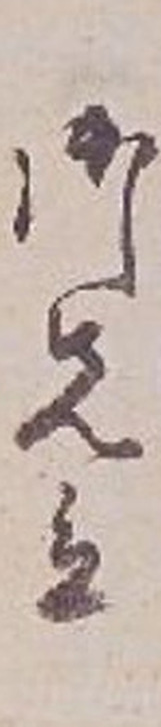御先立
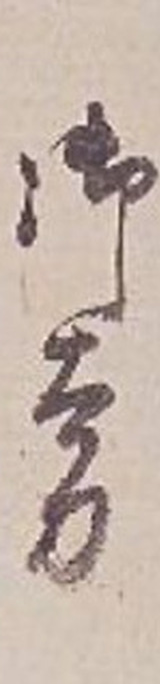御太刀
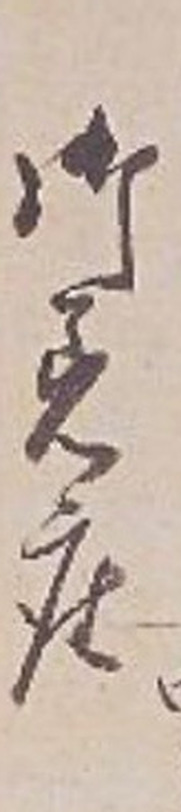御着座
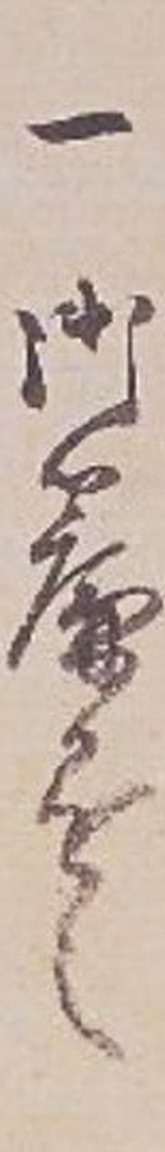一御簾懸候
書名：琉球人来朝記 三、四
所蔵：University of the Ryukyus Library
